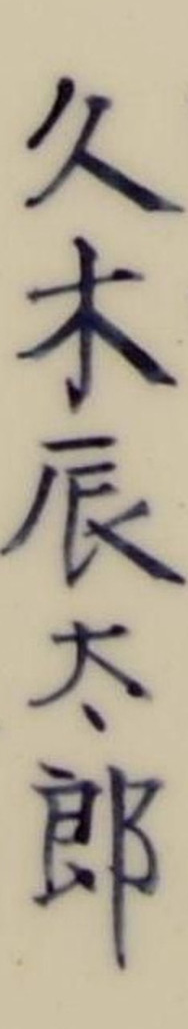久木辰太郎
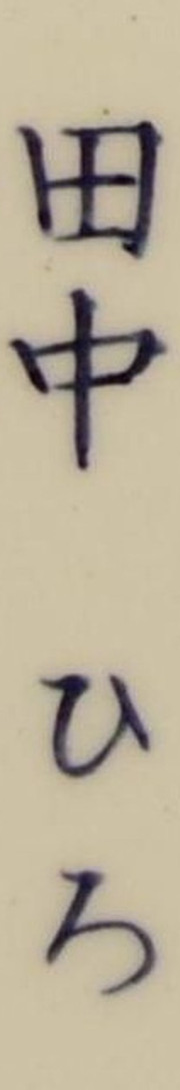田中ひろ
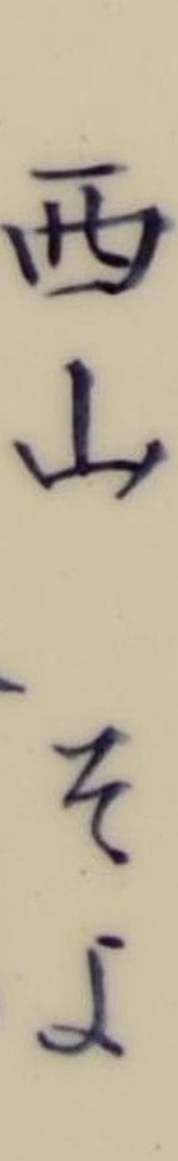西山そよ
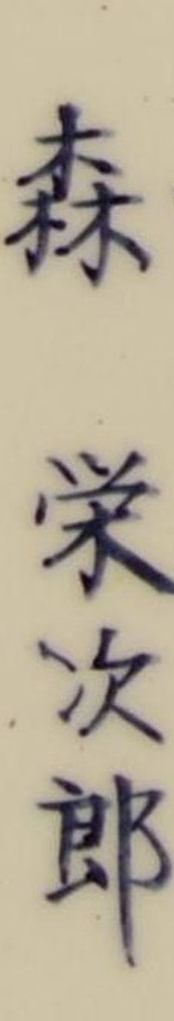森栄次郎
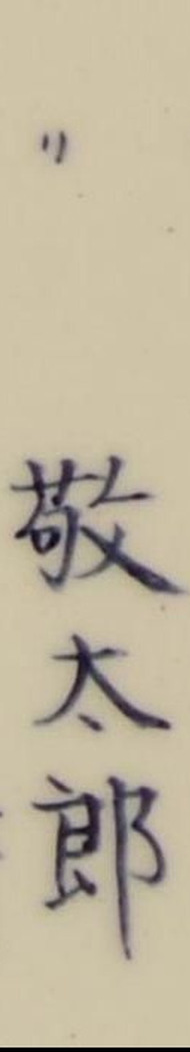敬太郎
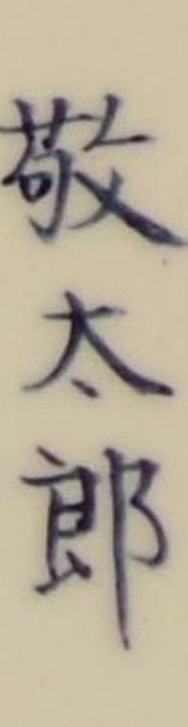敬太郎
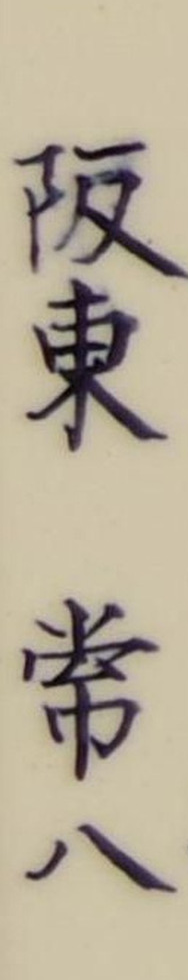阪東常八

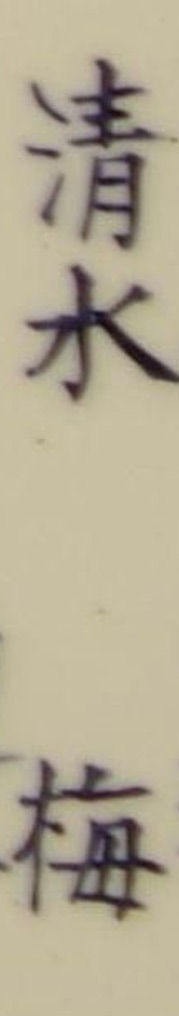清水梅
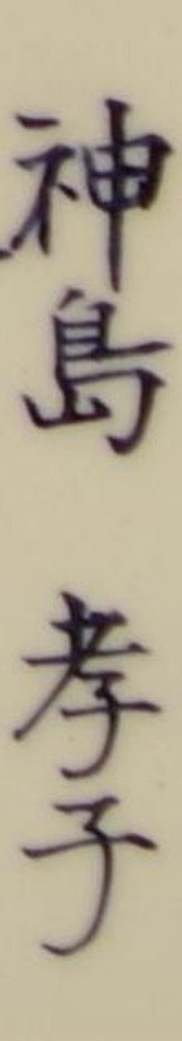神島孝子
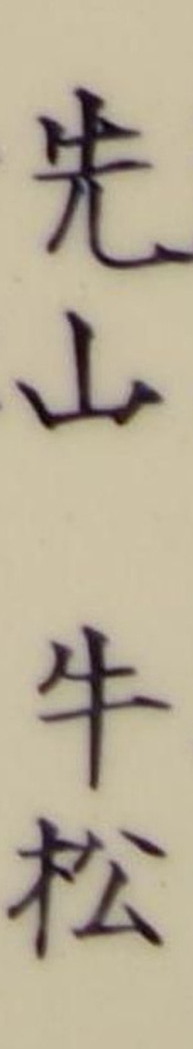先山牛松
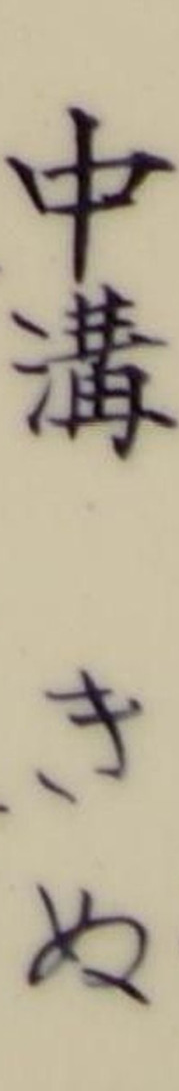中溝きぬ
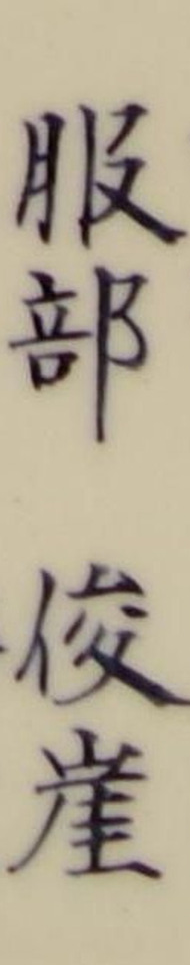服部俊崖
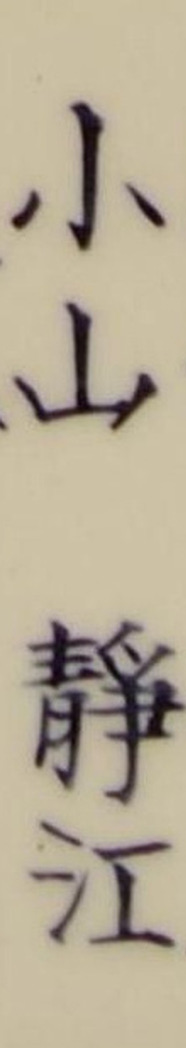小山静江
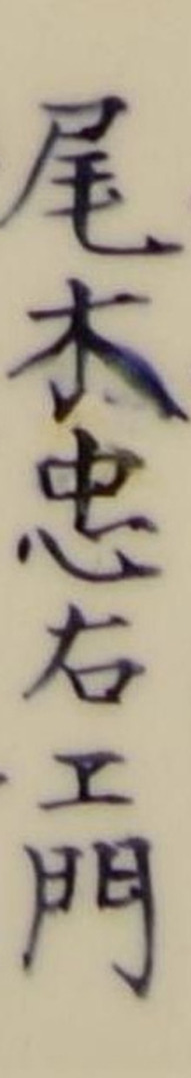尾木忠右エ門
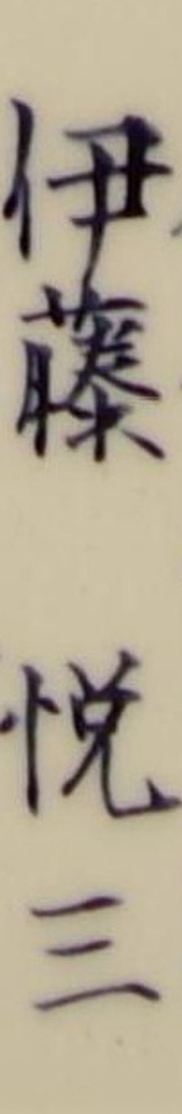伊藤悦三
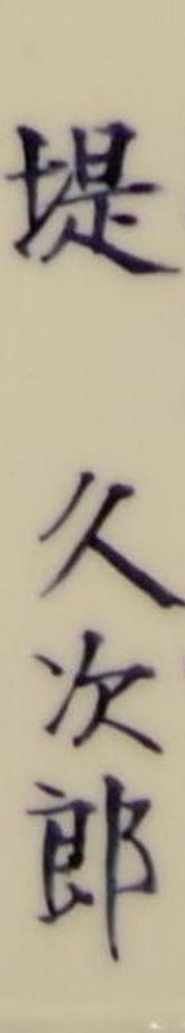堤久次郎
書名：E~L
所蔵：高野山金剛峯寺
